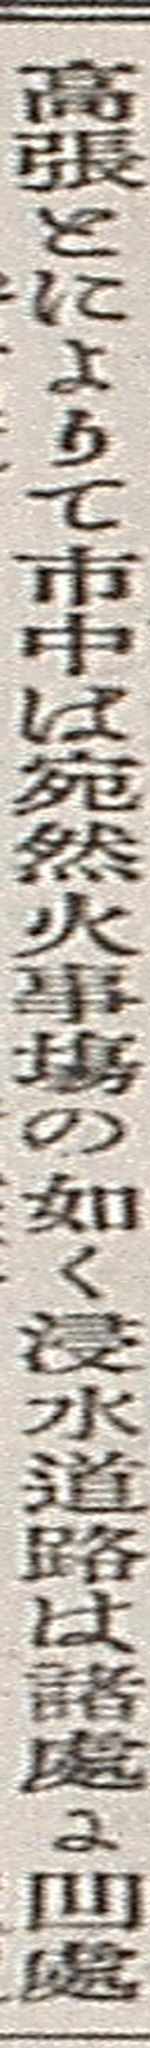高張ちによりて市中は宛然火事場の如く浸水道路は諸処に凹処
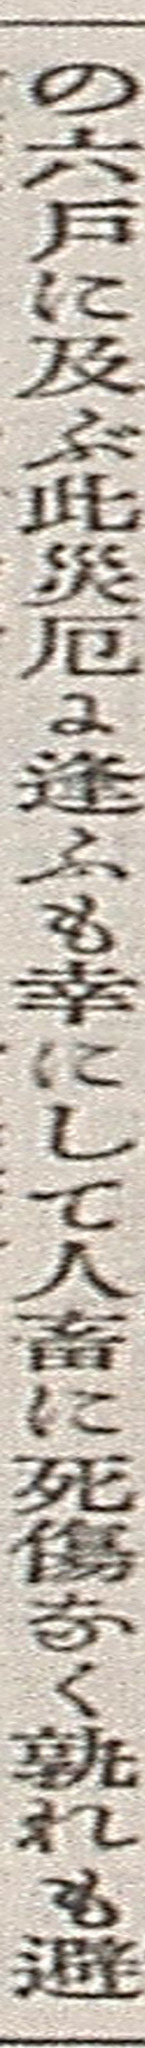の六戸に及ぶ此災厄に逢ふも幸にして人畜に死傷なく孰れも避
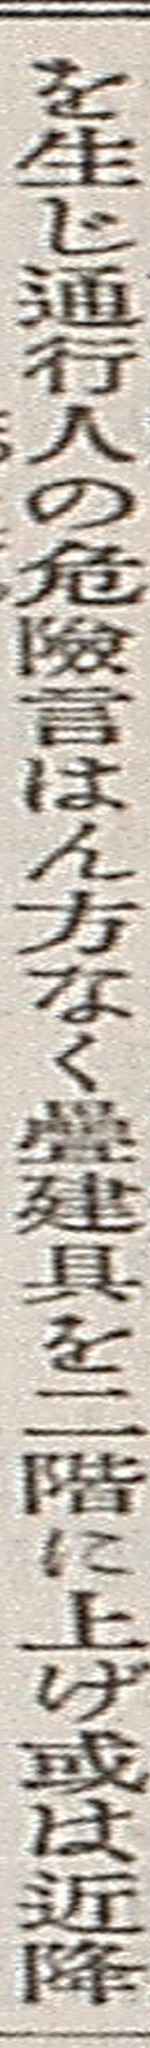を生じ通行人の危険言はん方なく畳建具を二階に上げ或は近降
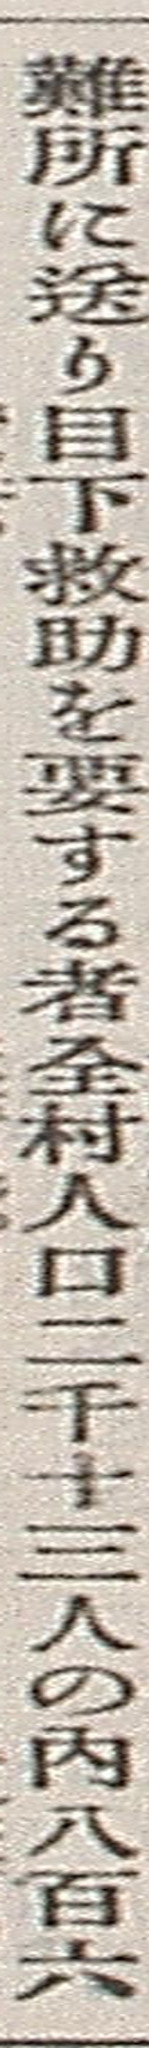難所に送り目下救助を要する者全村人口二千十三人の内八百六
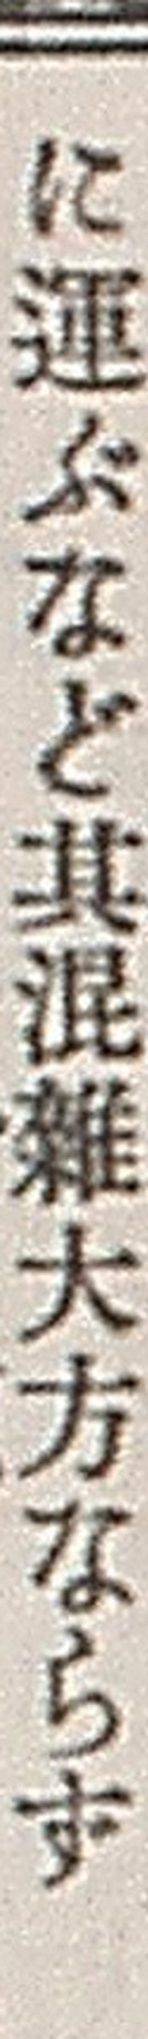に運ぶなど其混雑大方ならず
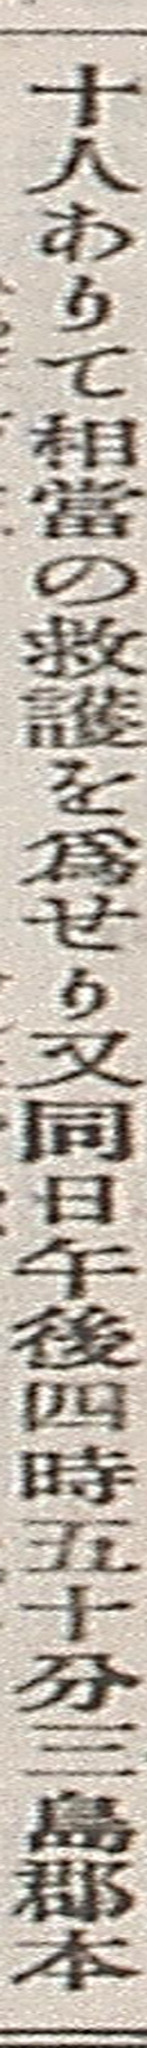十人ありて相当の救護を為せり又同日午後四時五十分三島郡本
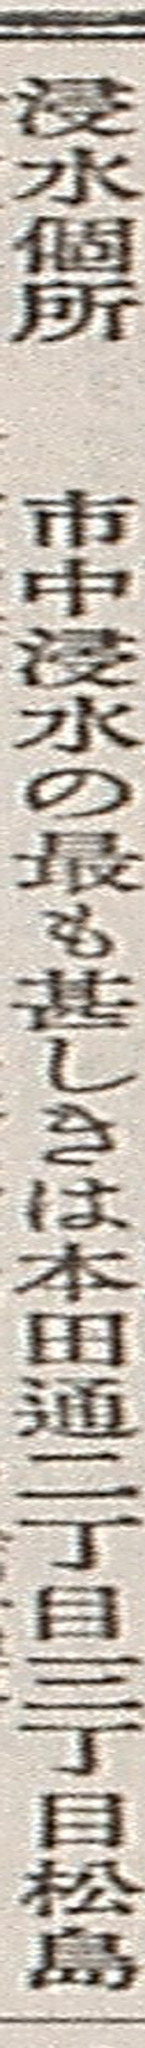浸水個所市中浸水の最も甚しきは本田通二丁目三丁目松島
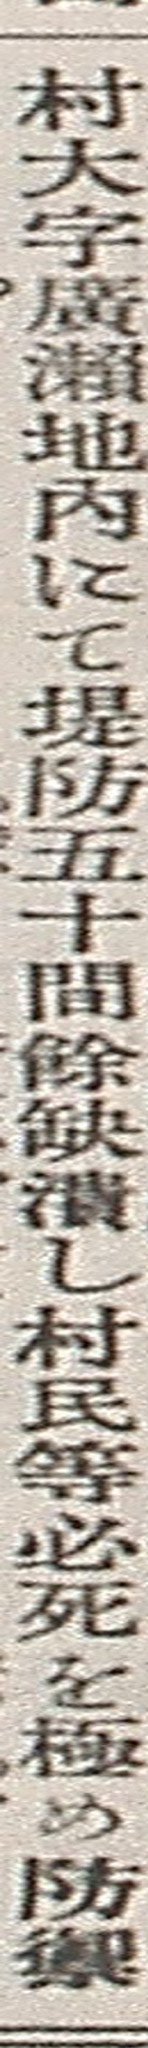村大字広瀬地内にて堤防五十間餘缺潰し村民等必死を極め防禦
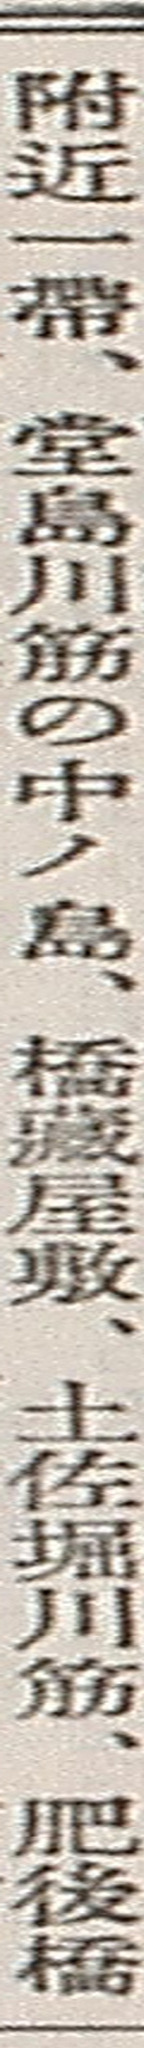附近一帯、堂島川筋の中の島、橋蔵屋敷、土佐堀川筋、肥後橋
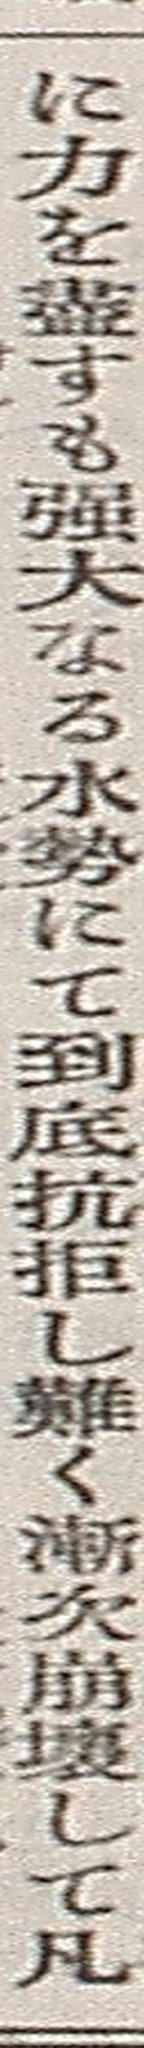に力を盡すも強大なる水勢にて到底抗拒し難く漸次崩壊して凡
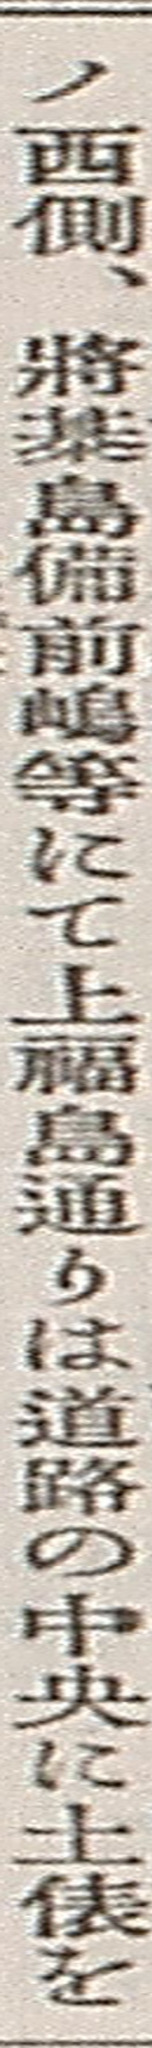ノ西側、将綦島備前嶋等にて上福島通りは道路の中央に土俵を
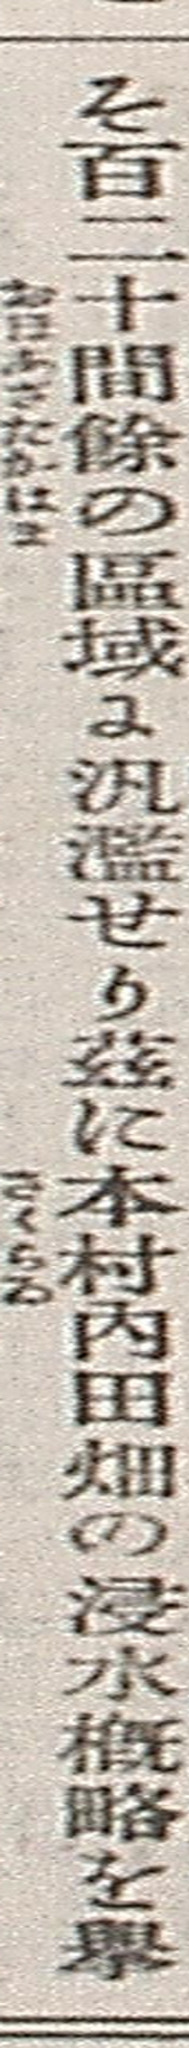そ百二十間餘の區域に汎濫せり玆に本村内田畑の浸水概略を挙
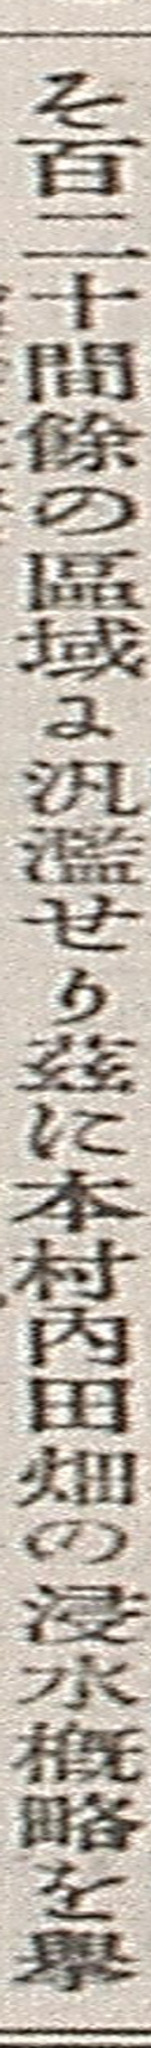そ百二十間餘の區域に汎濫せり玆に本村内田畑の浸水概略を挙
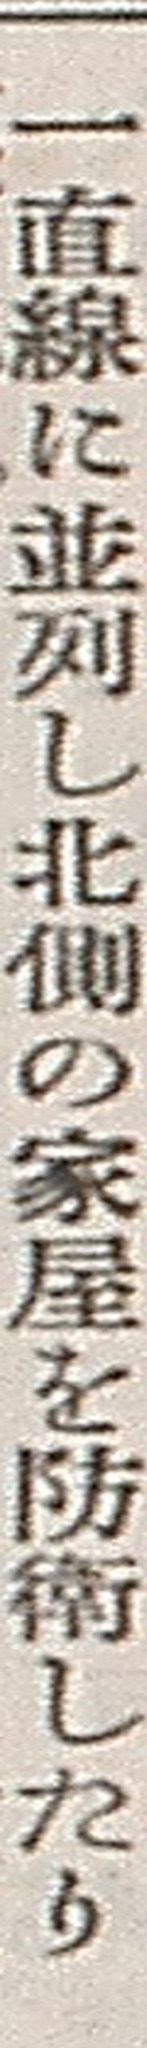一直線に並列し北側の家屋を防禦したり
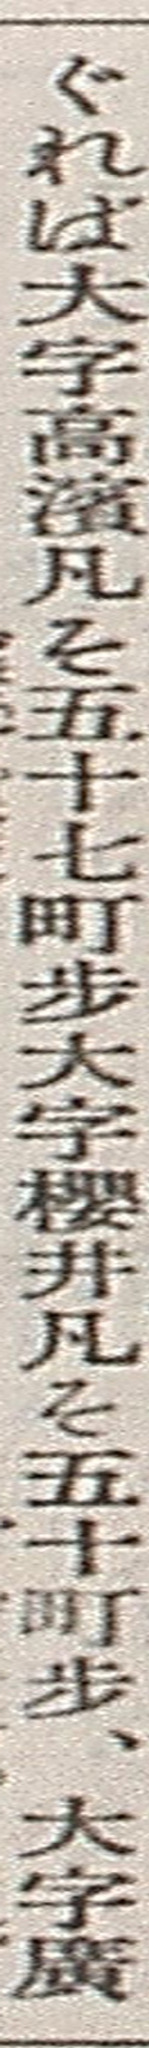ぐれば大字高浜凡そ五十七町歩大字桜井凡そ五十町歩、大字広
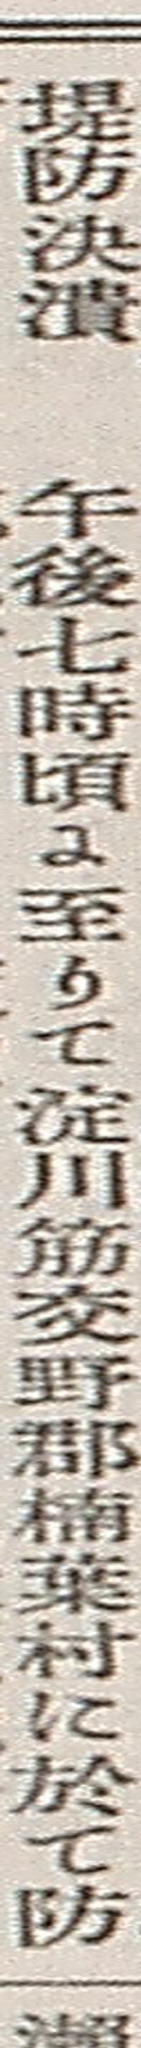堤防決潰午後七時頃に至りて淀川筋交野郡楠葉村に於て堤
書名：風俗畫報臨時増刊第百二十八號　洪水被害録（下）
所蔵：東京大学地震研究所図書室 Earthquake Research Institute Library, The University of Tokyo, JAPAN
